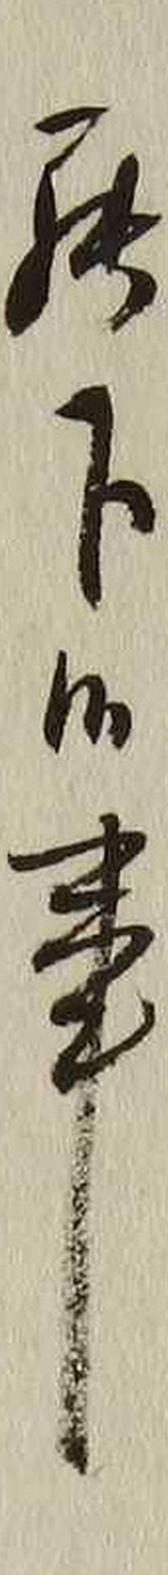罷下候事
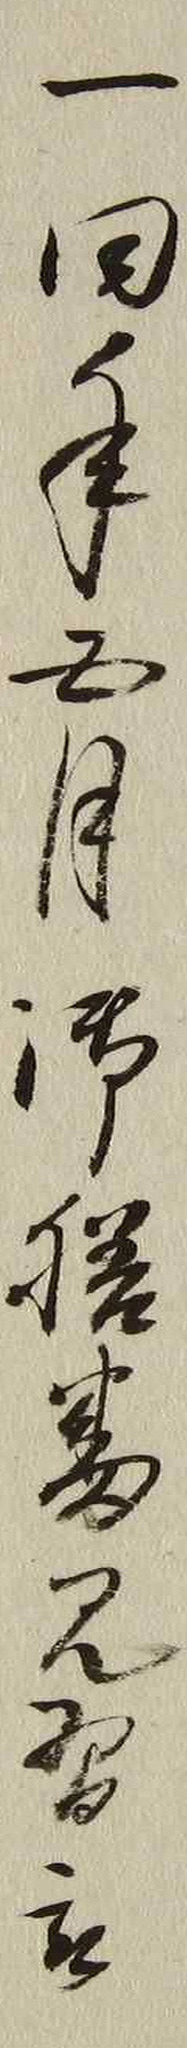一同年五月御膳番見習被
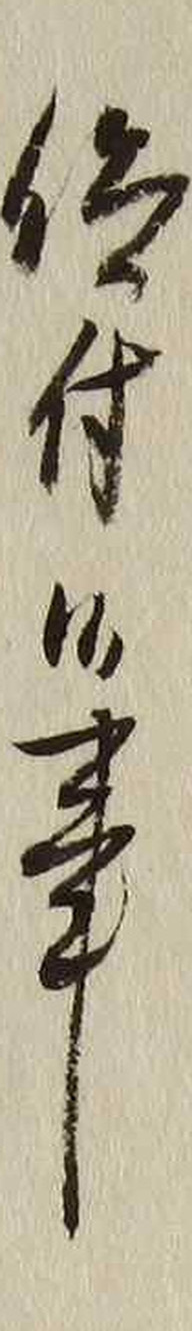仰付候事
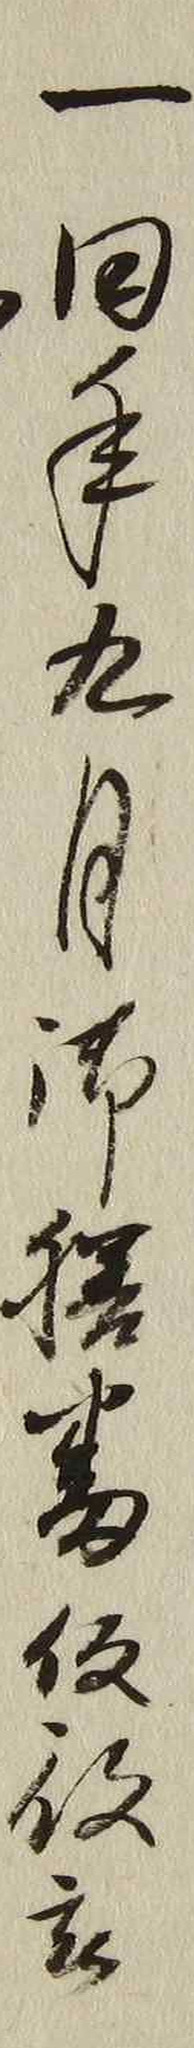一同年九月御膳番仮役被
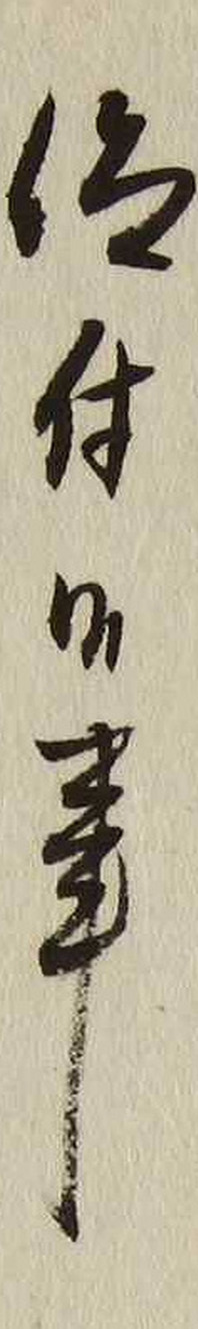仰付候事
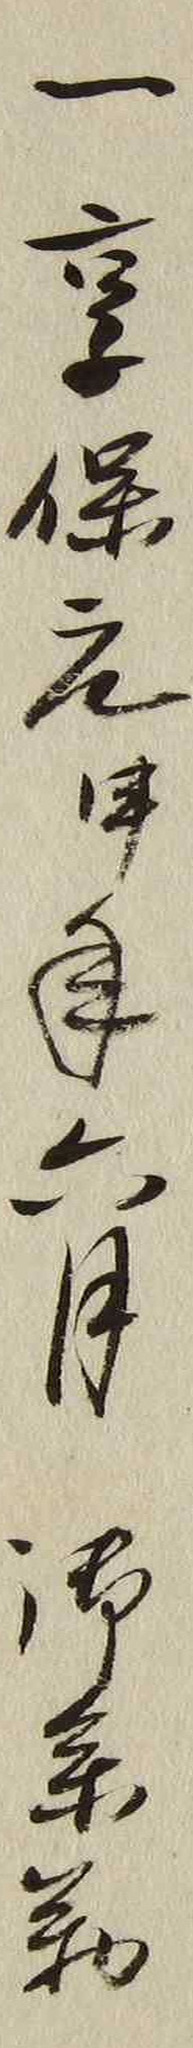一享保元申年六月御参勤
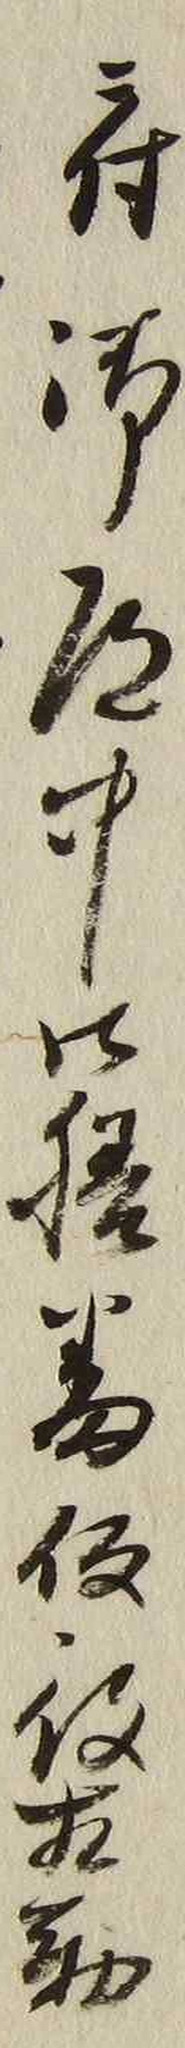ニ付御道中御膳番仮役相勤
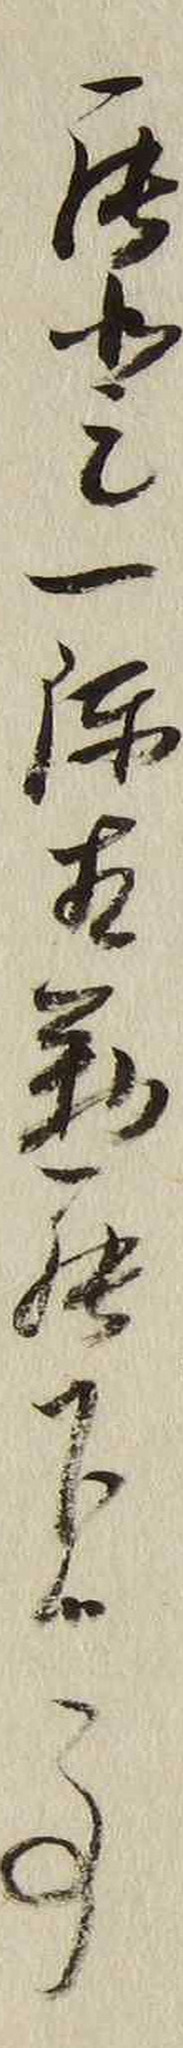罷登一陣相勤罷下候事
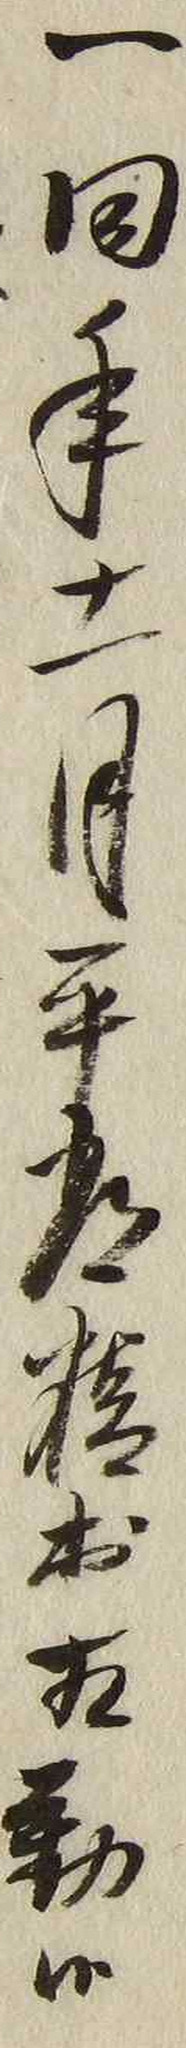一同年十一月平常精出相勤候
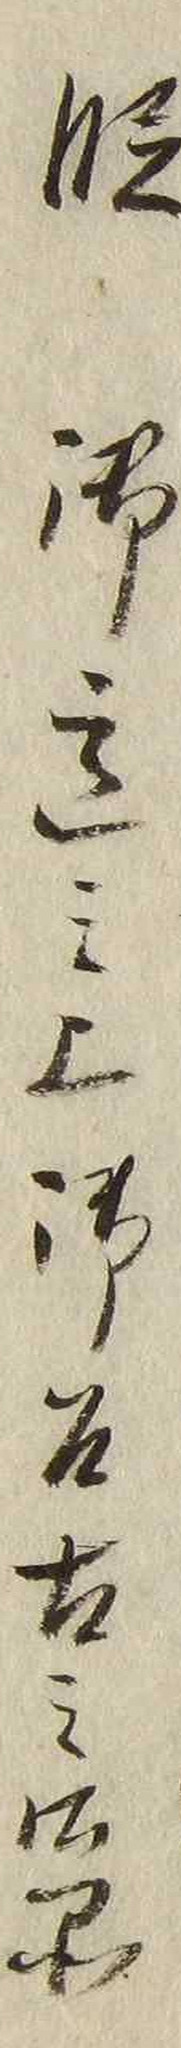段御意之上御召古之御品

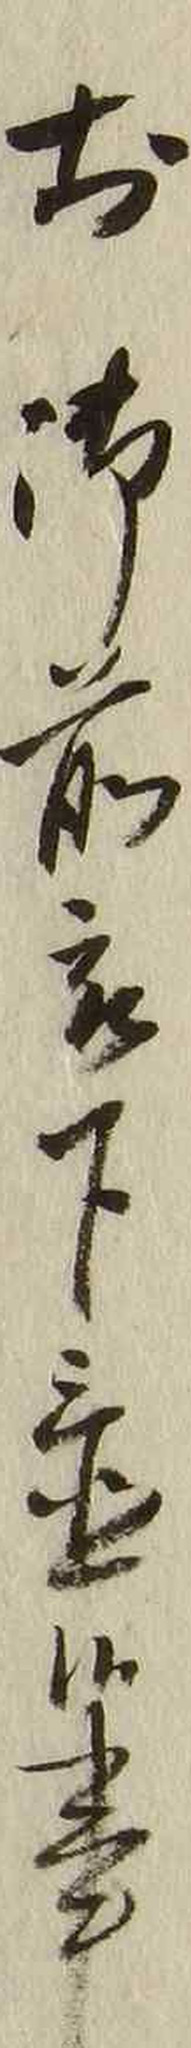於御前被下置候事
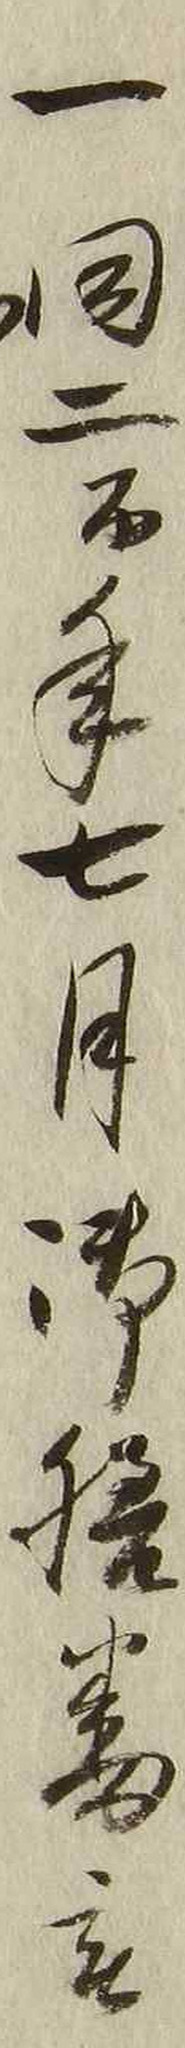一同二酉年七月御膳番被
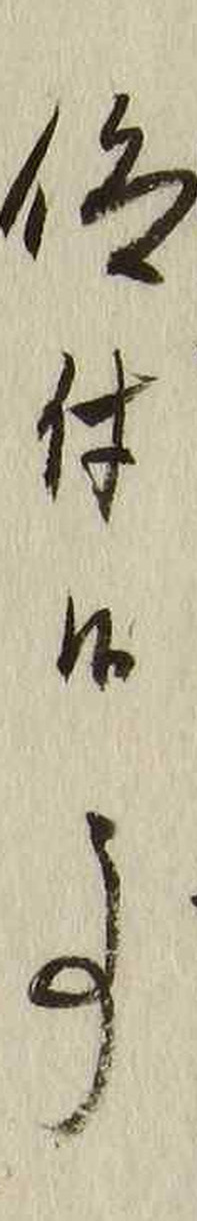仰付候事
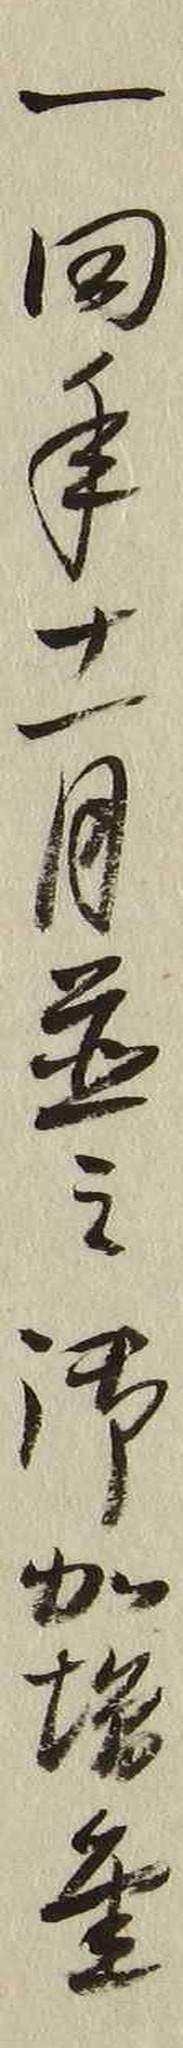一同年十一月並之御加増金
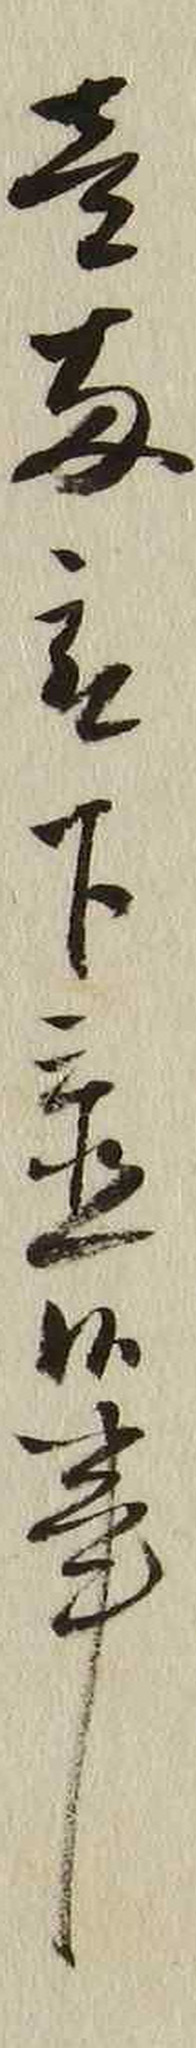壱両被下置候事
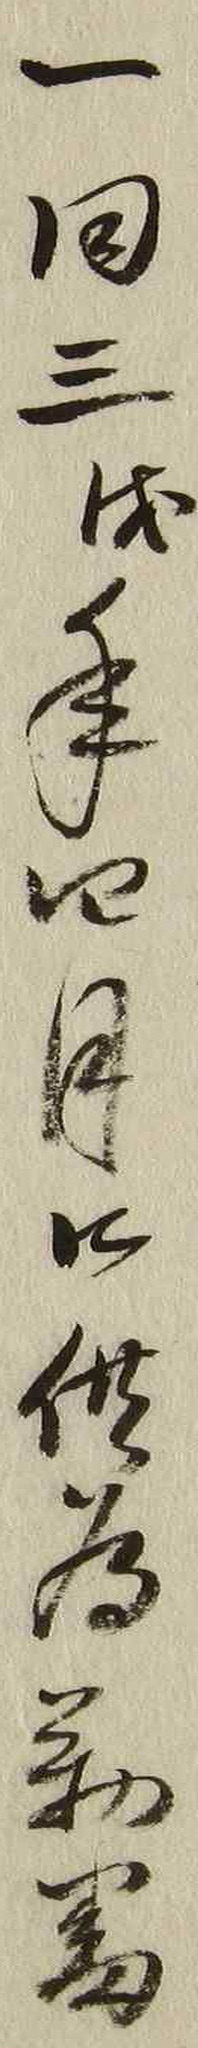一同三戌年四月御供為勤番
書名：諸士系譜　巻之355　す之部5
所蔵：会津若松市立会津図書館
